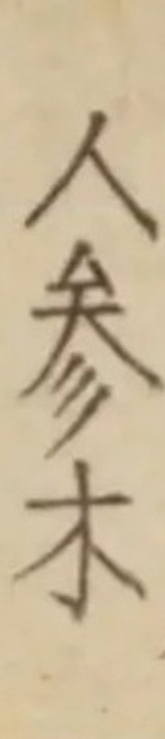人参木
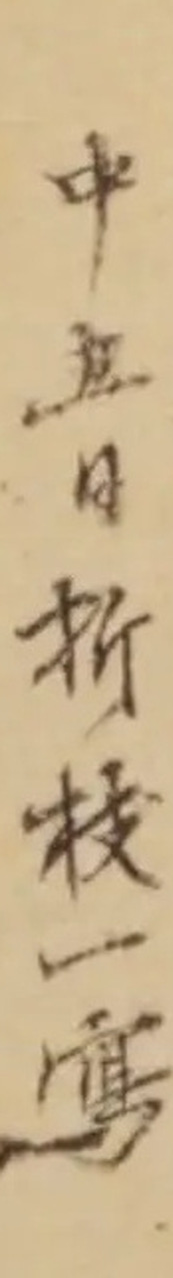中五日折枝一寫

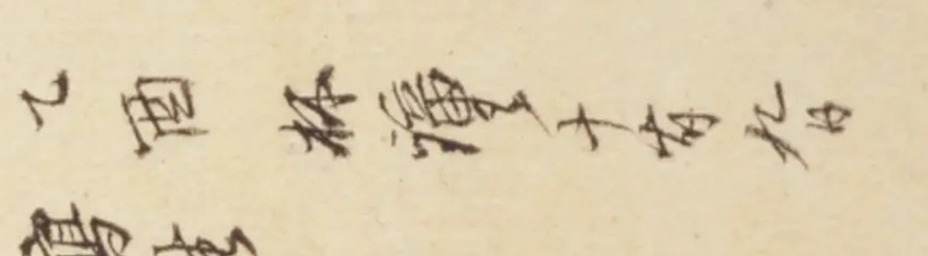乙酉林鐘十有九日
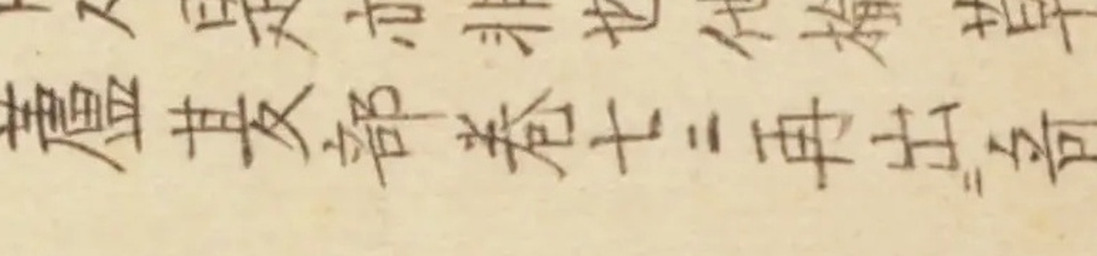蘆夏部巻七二歳出竒品
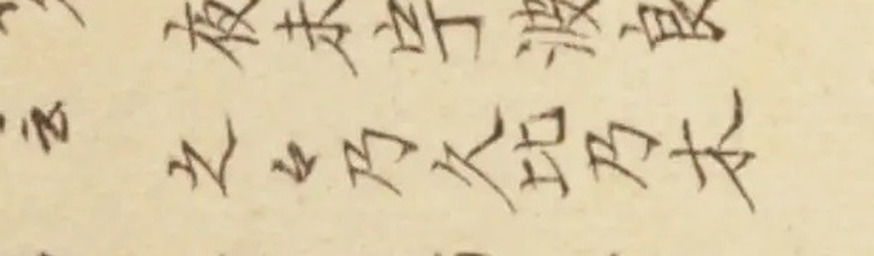一に云之々乃久比乃木
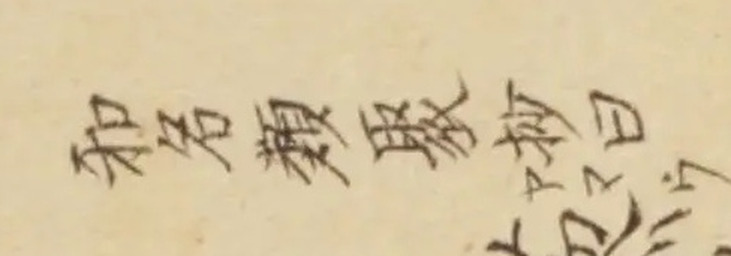和名類聚抄ニ曰

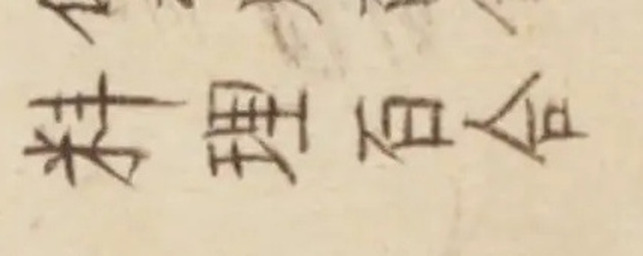料理百合
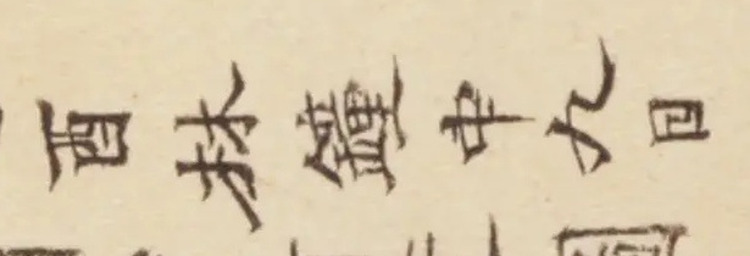乙酉林鐘中九日
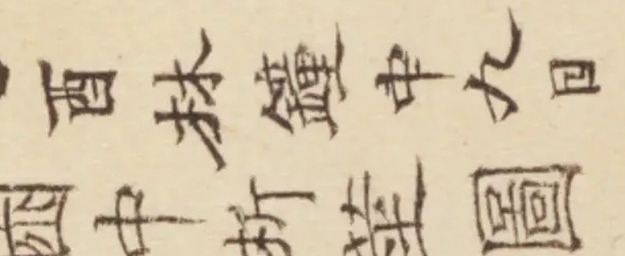乙酉林鐘中九日
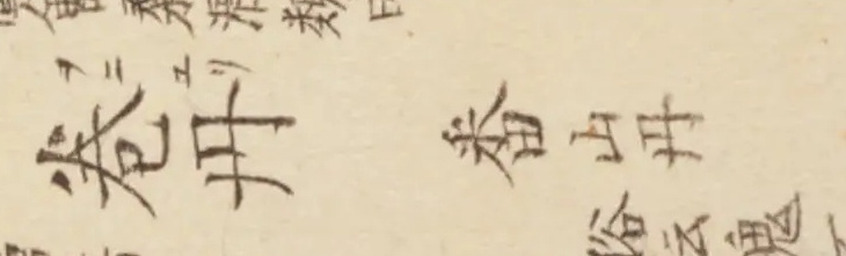巻丹番山丹
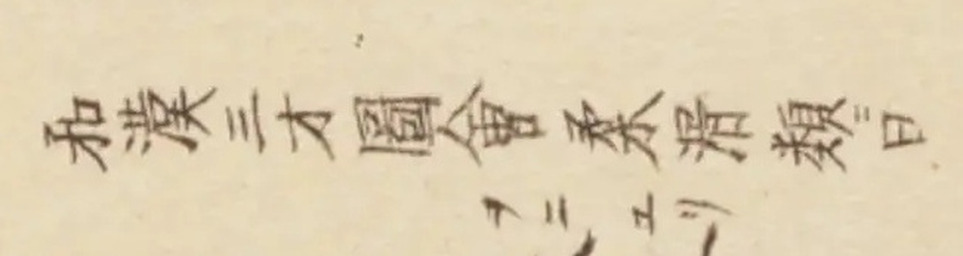和漢三才圖會柔滑類に曰
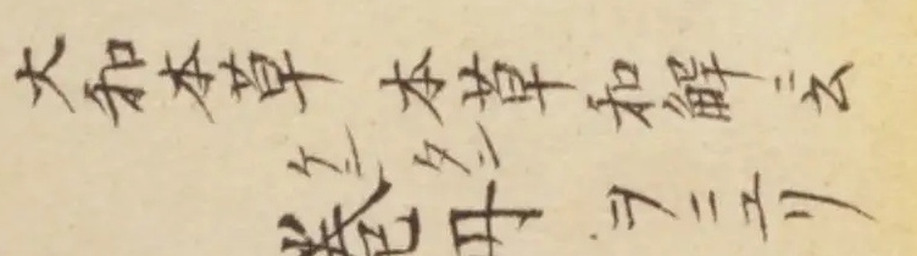大和本草本草和解に云
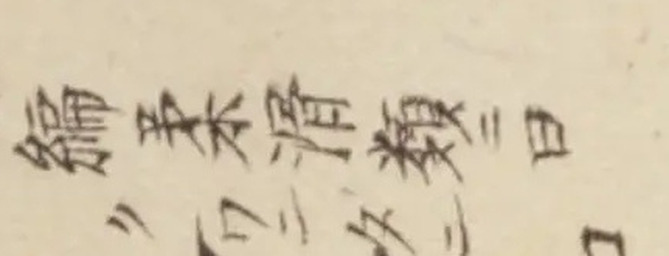多識編柔滑類ニ曰
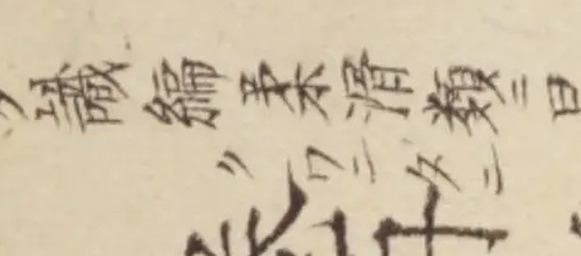多識編柔滑類ニ曰
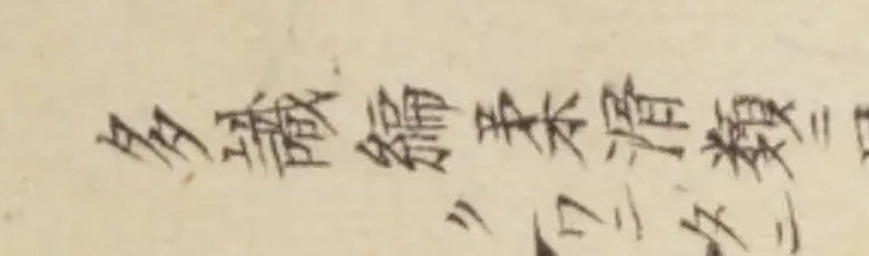多識編柔滑類ニ曰

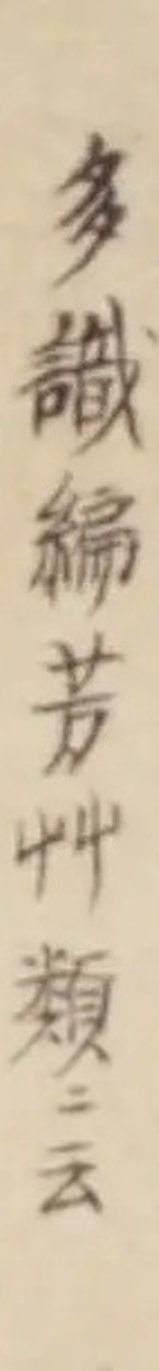多識編芳艸類ニ曰
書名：梅園草木花譜夏之部. 3
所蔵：国立国会図書館 National Diet Library, JAPAN
